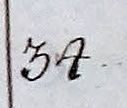34
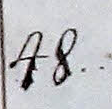48
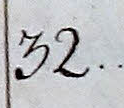32
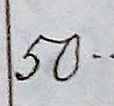50
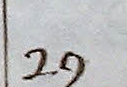29
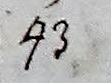43
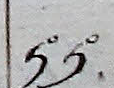55
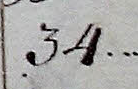34
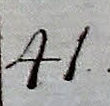41
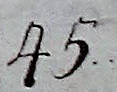45
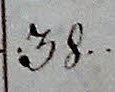38
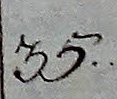35
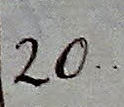20
